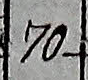70
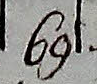69
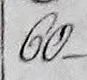60
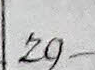29
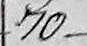70
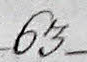63
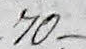70
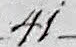41
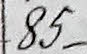85
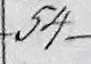54
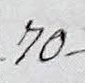70
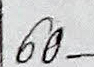60
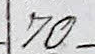70
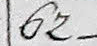62
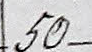50
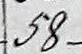58
